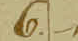6.
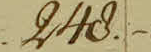248.
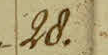28.
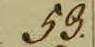53.
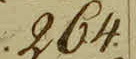264.
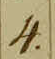4.
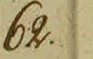62.
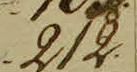212.
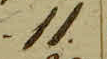11.
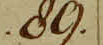89.
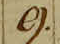9.
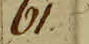61.
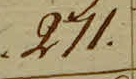271.
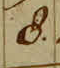8.
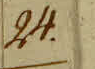24.
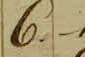6.
